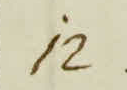12
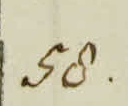58
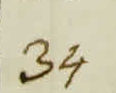34
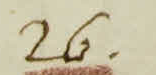26.
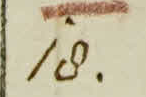18.
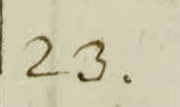23.
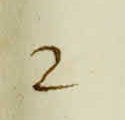2
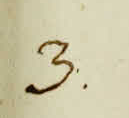3.
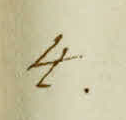4.
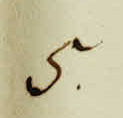5.
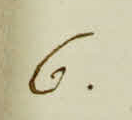6.
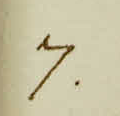7.
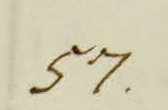57.
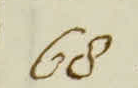68.
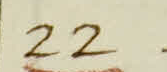22
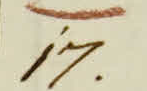17.
